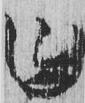曰
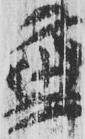亞（惡）
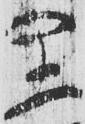○（危）
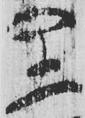○（危）
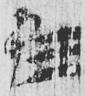於
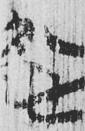忿
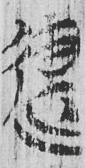連（戾）
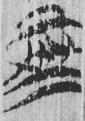亞（惡）
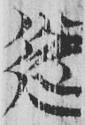○（失）
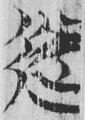○（失）
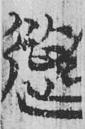道
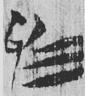於
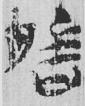脂（嗜）
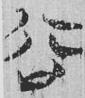谷（欲）
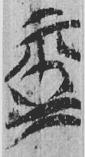亞
